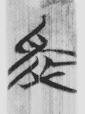卒B
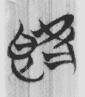既
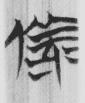備
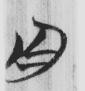舟
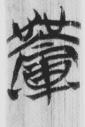{𠅞車}
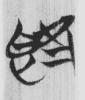既
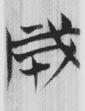成
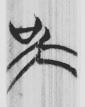吳
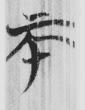帀
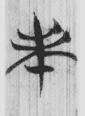未
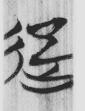{辶巳}
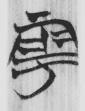𩁹
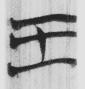王
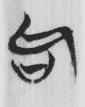句
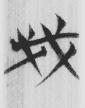{戈戈}
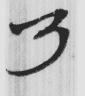乃
